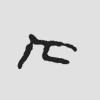亓（其）
